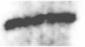一
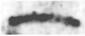一
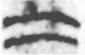二
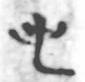屯
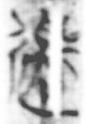○（衡）
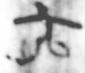戹（軛）
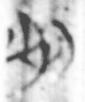削
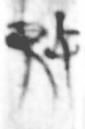敗
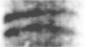二
